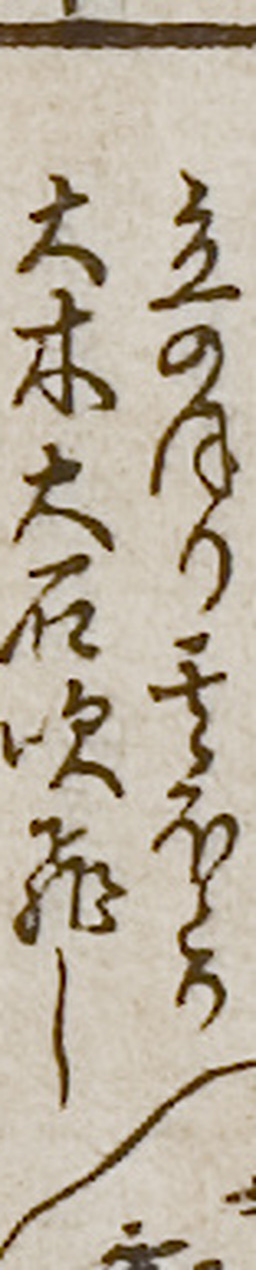大木大石吹飛し
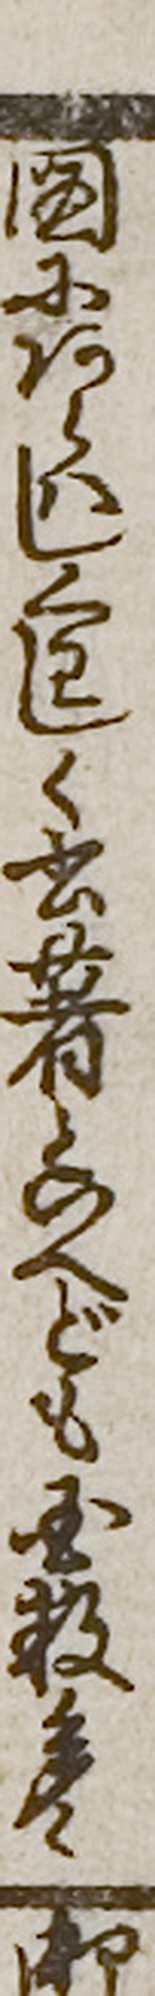図にあらはしくわしく書著といへども国数多く
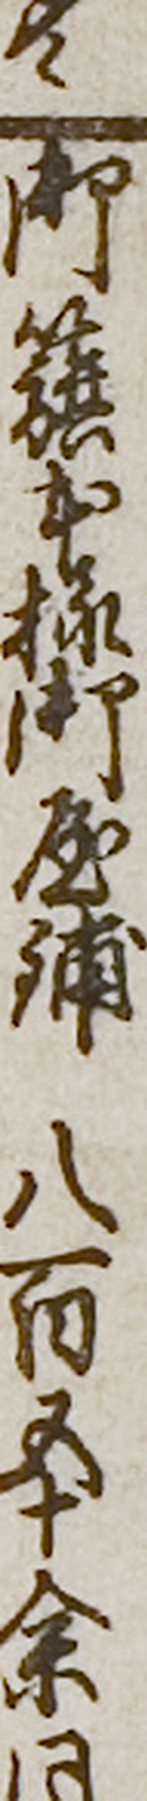御旗本様御屋鋪八百五十余同
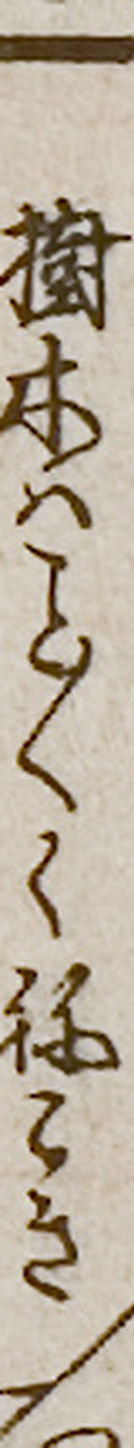樹木はこと〴〵くねこき
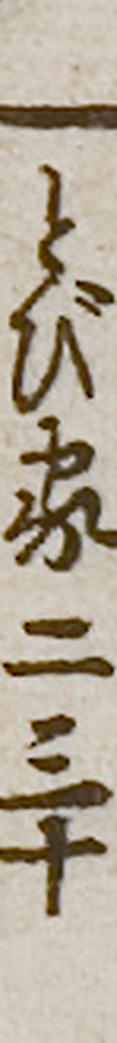とび家二三十
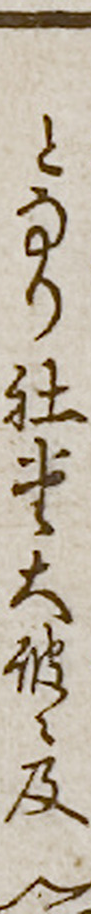となり社堂大破に及
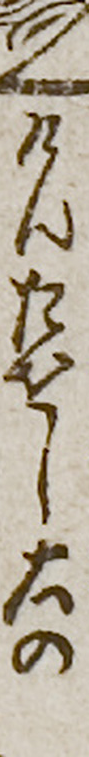けんたをし右の
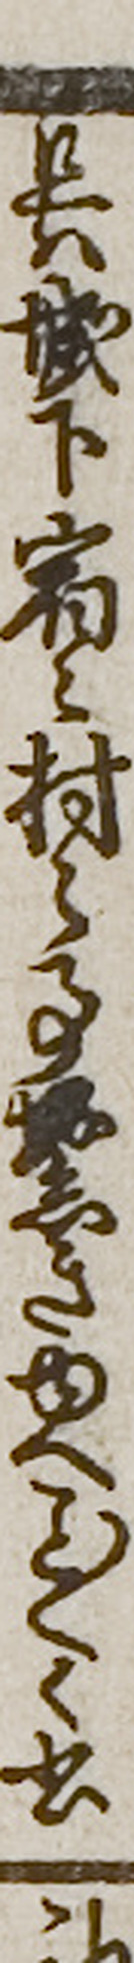且は城下宿々村々事しきゆへこと〴〵く書
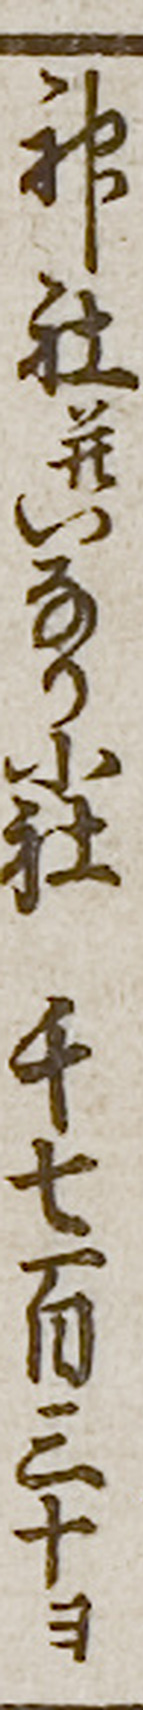神社并いなり小社千七百三十よ
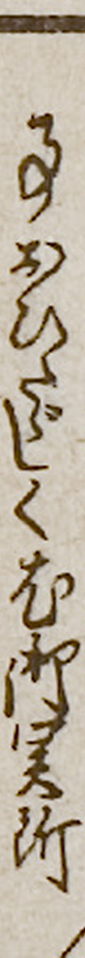事おびたゞしく尤御関所
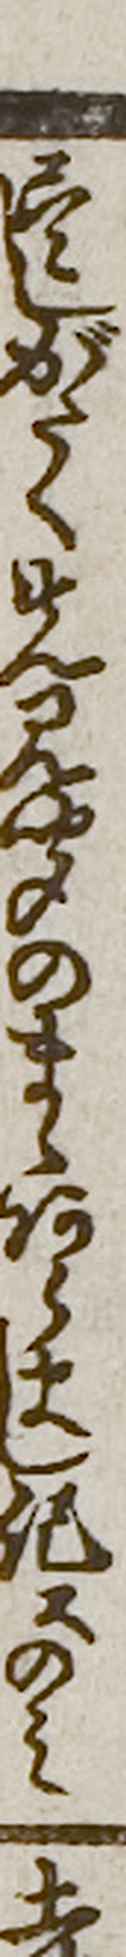尽しがたく先見聞のまゝあらましきすのみ
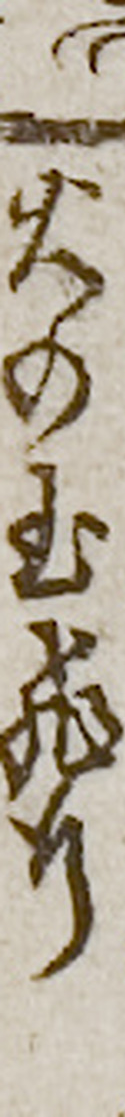火の玉飛行
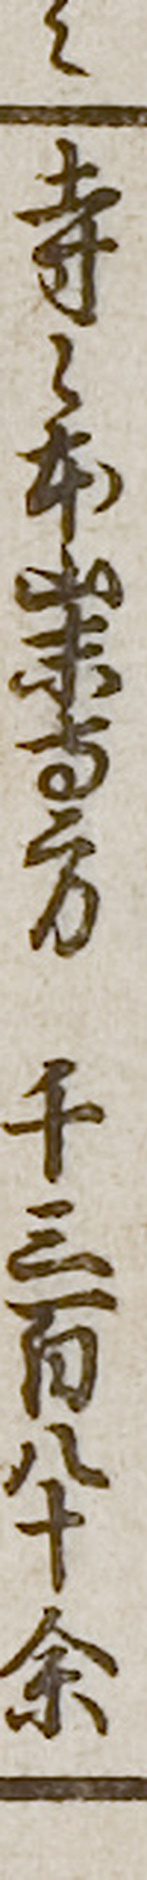寺々本山末寺方千三百八十余
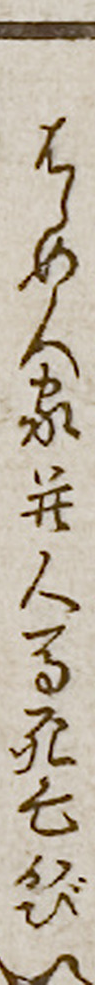はしめ人家并人馬死亡おび
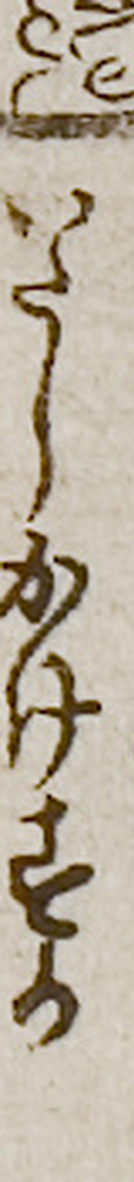いたしかけすか
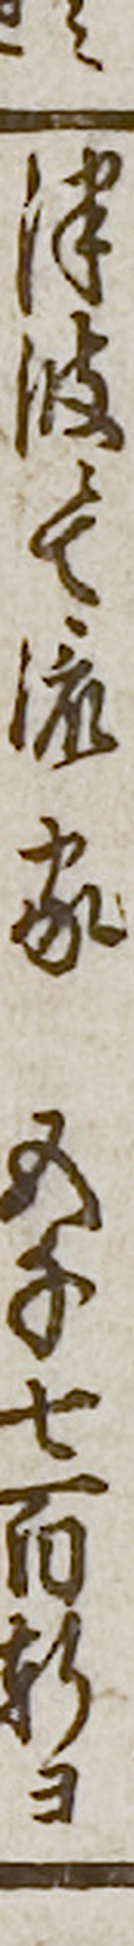津波にて流家五千七百軒よ
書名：江戸東海道東国荒珍事図
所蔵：東京大学総合図書館 General Library in the University of Tokyo, JAPAN
